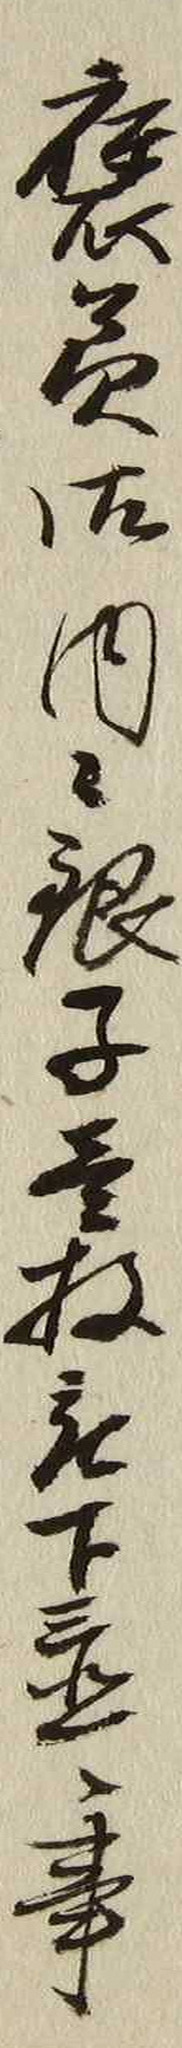褒美御内々銀子壱枚被下置候事
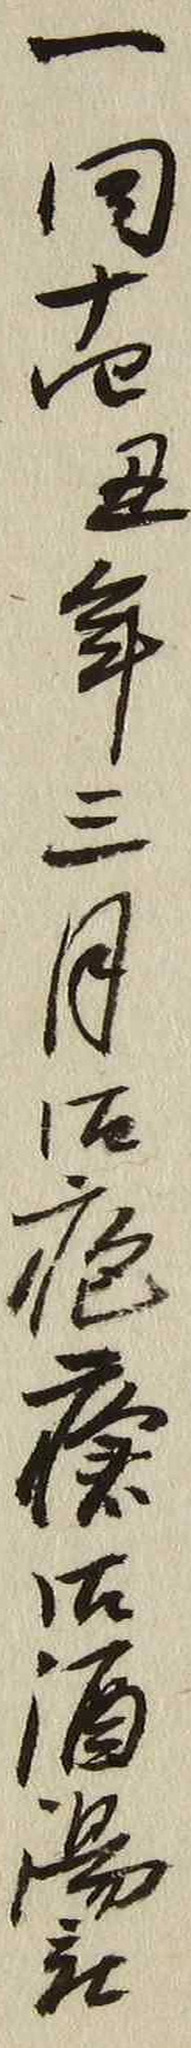一同十四丑年三月御庖瘡御酒湯被
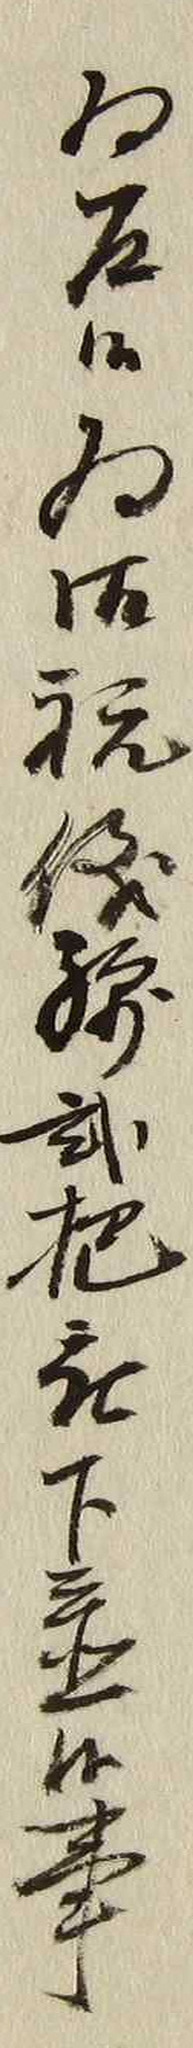為召候為御祝儀綿弐把被下置候事
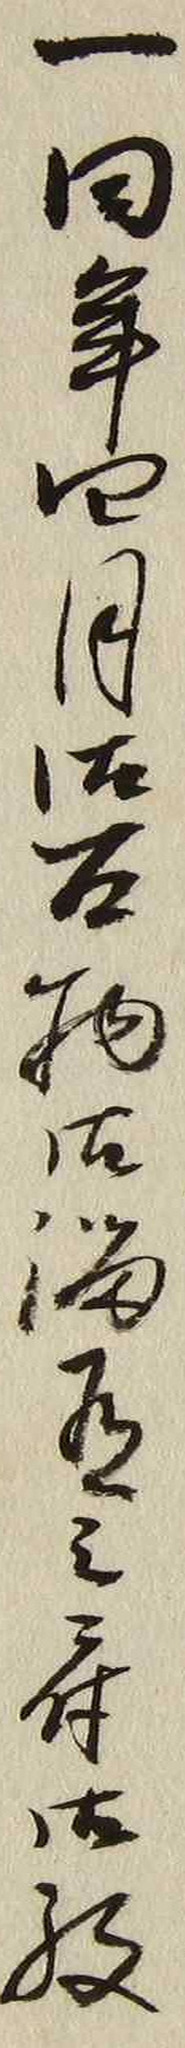一同年四月御召物御溜有之ニ付御紋
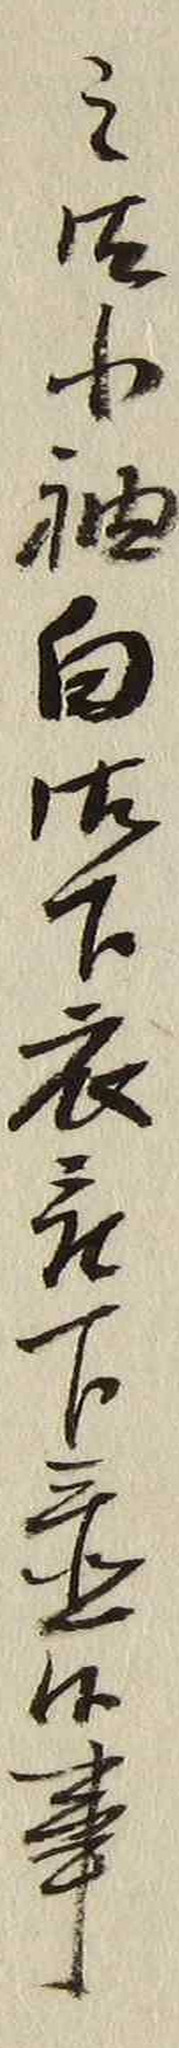之御小袖白御下衣被下置候事
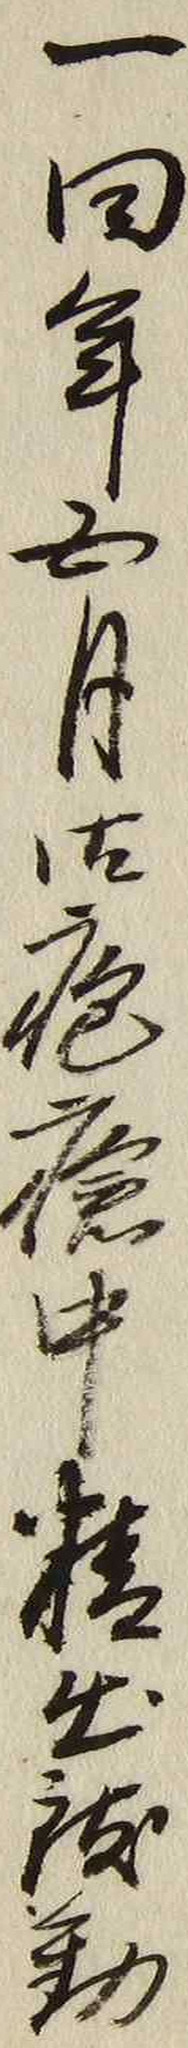一同年五月御庖瘡中精出致勤
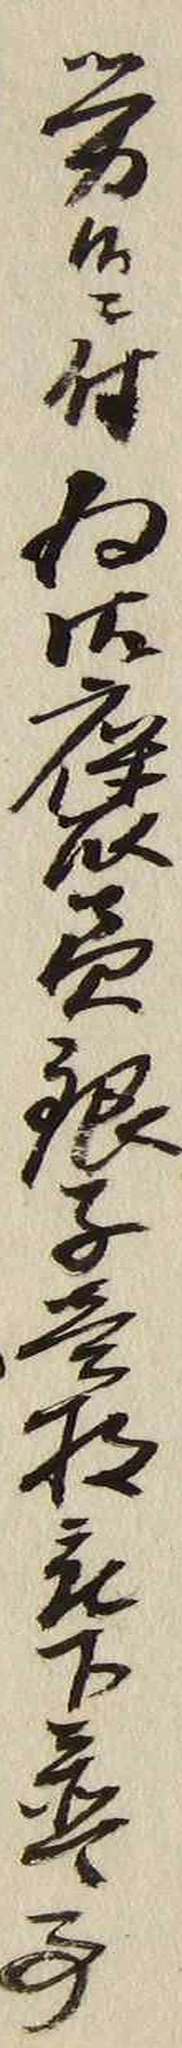労候ニ付為御褒美銀子壱枚被下置候事
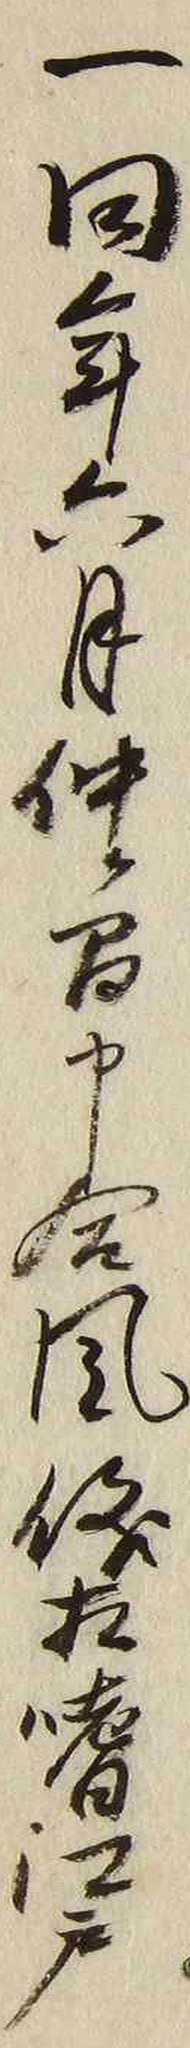一同年六月仲ケ間申合風儀相嗜江戸

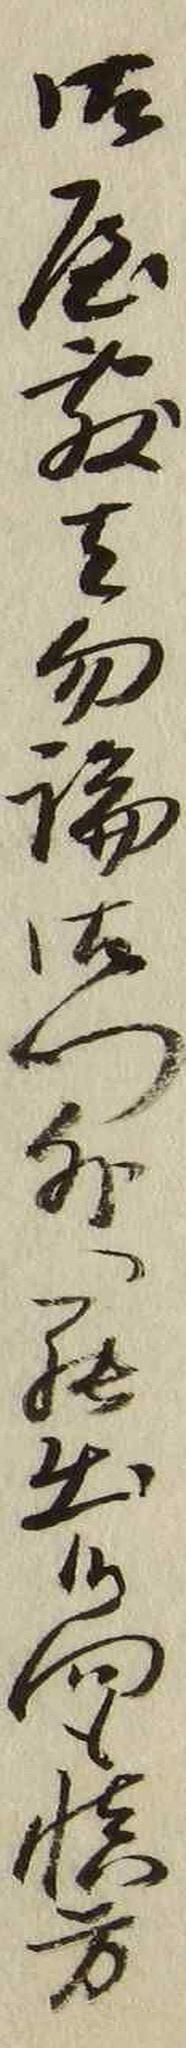御屋敷者勿論御門外へ罷出候向も慎】方
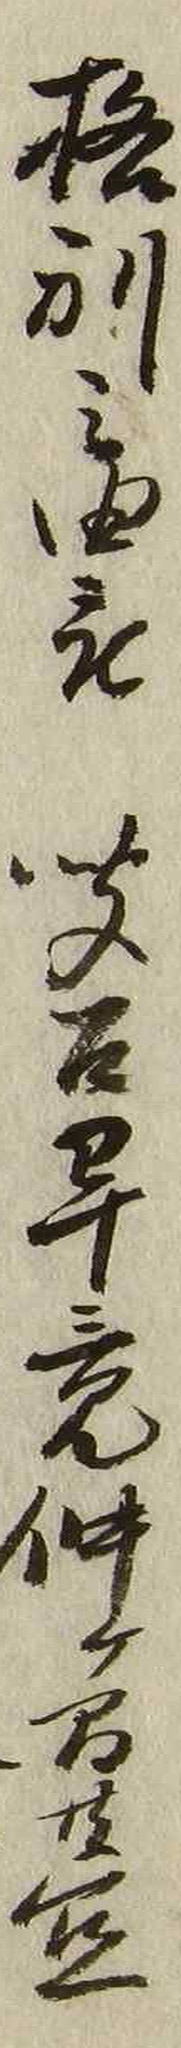格別之由被聞召畢竟仲ケ間共宜
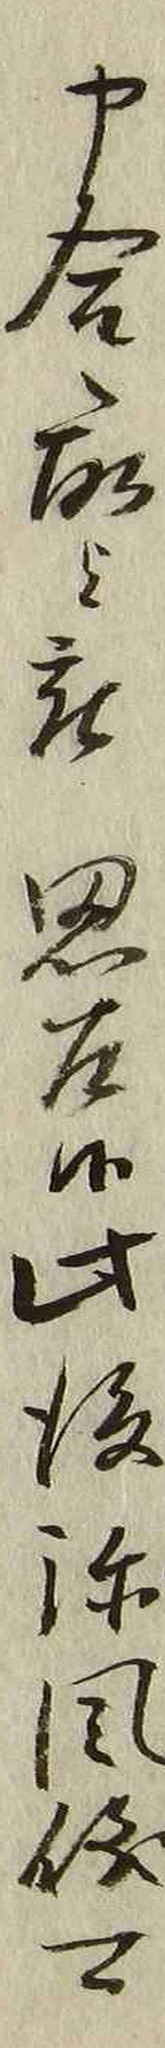申合候故与被思召候此後弥風儀可
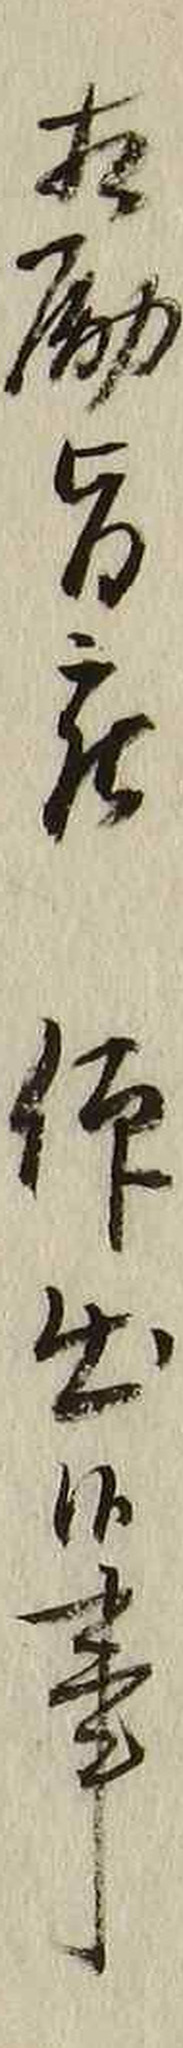相励旨被仰出候事
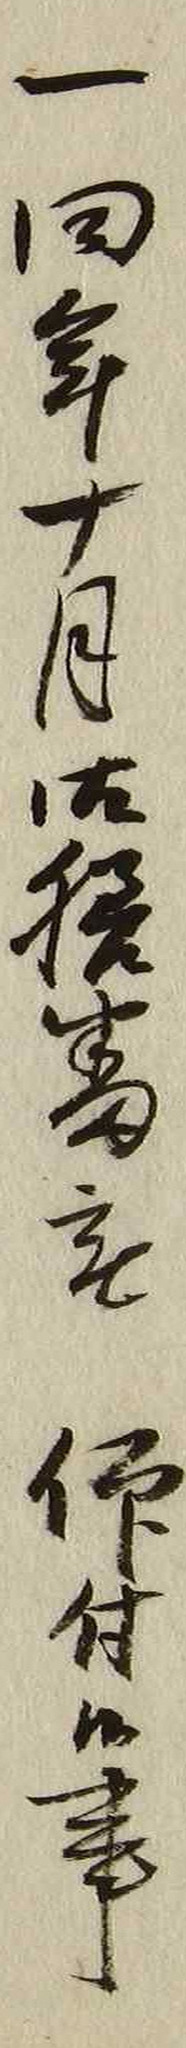一同年十月御膳番被仰付候事
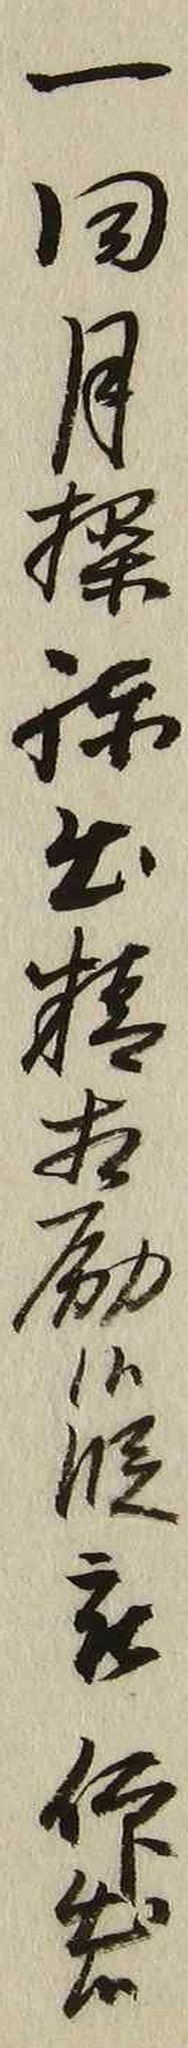一同月操練出精相励候段被仰出候
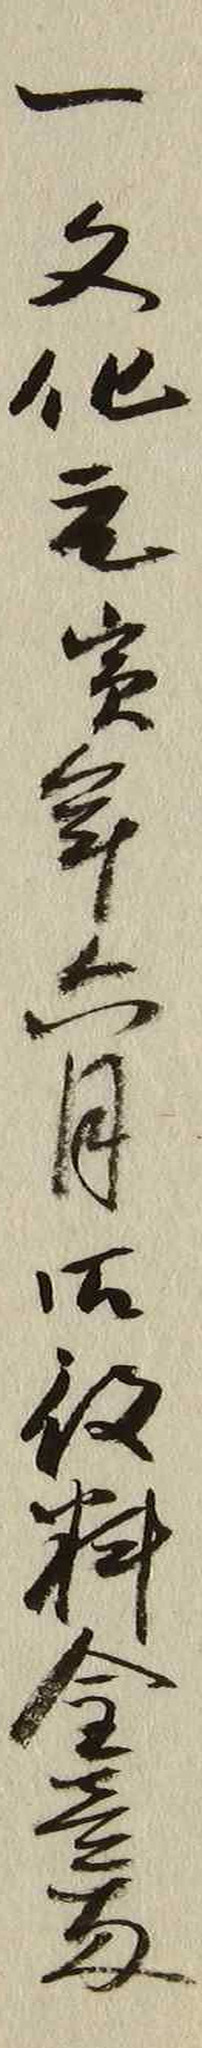一文化元寅年六月御役料金壱両
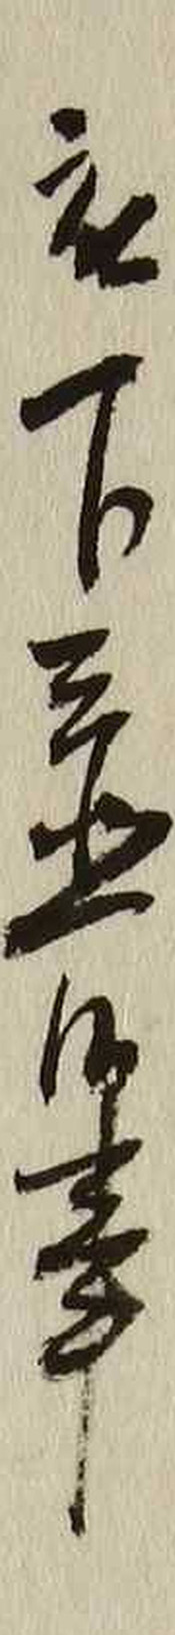被下置候事
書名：諸士系譜　巻之356　す之部6
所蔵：会津若松市立会津図書館
